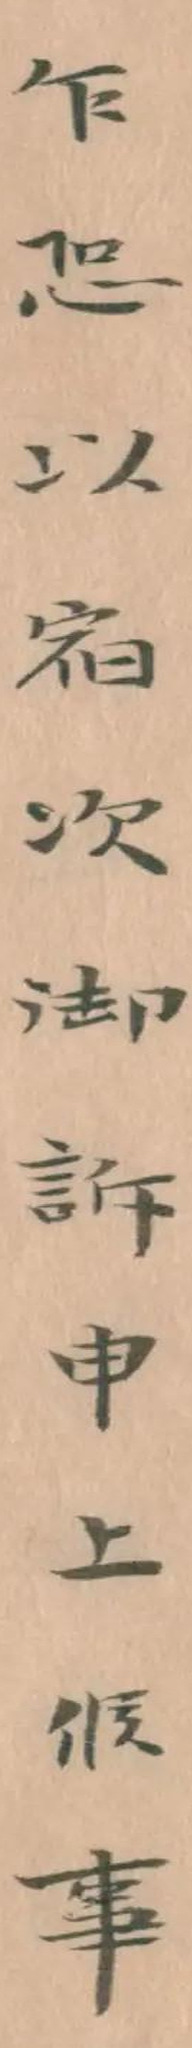乍恐以宿次御訴申上候事
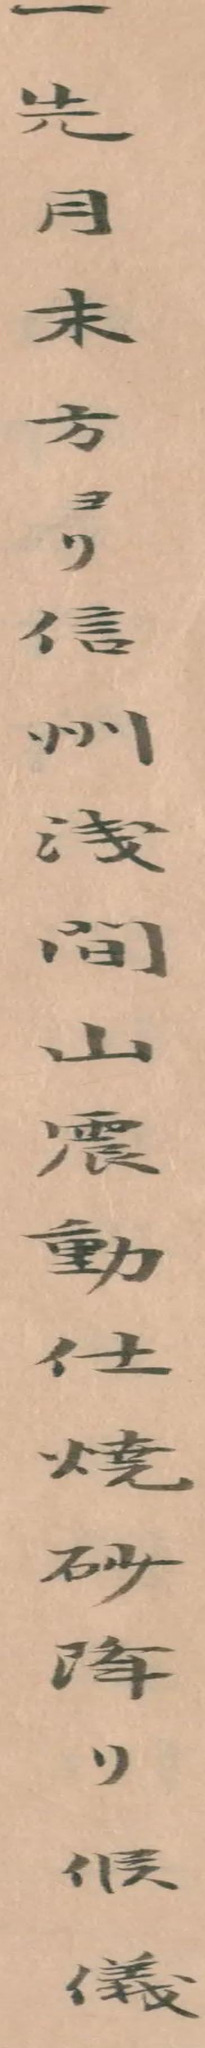一先月未片ヨリ信州浅間山震動仕焼砂降り候儀
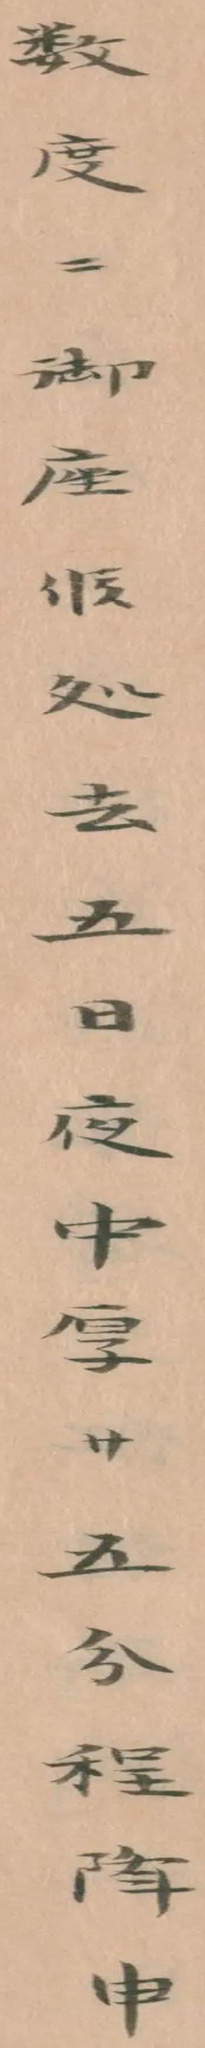数度二御座候処去五日夜中厚サ五分程降申
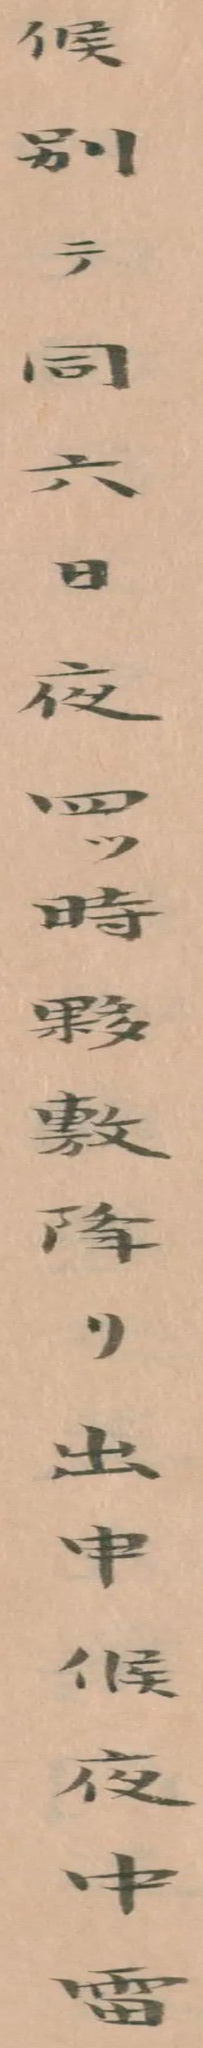候別テ同六日夜四ツ時夥敷降り出申候夜中雷
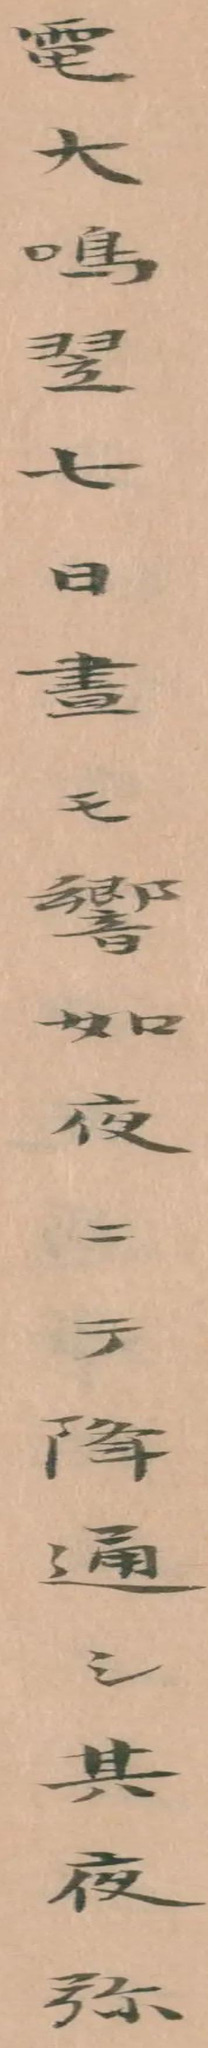電大鳴翌七日晝モ響如夜二テ降通シ其夜弥
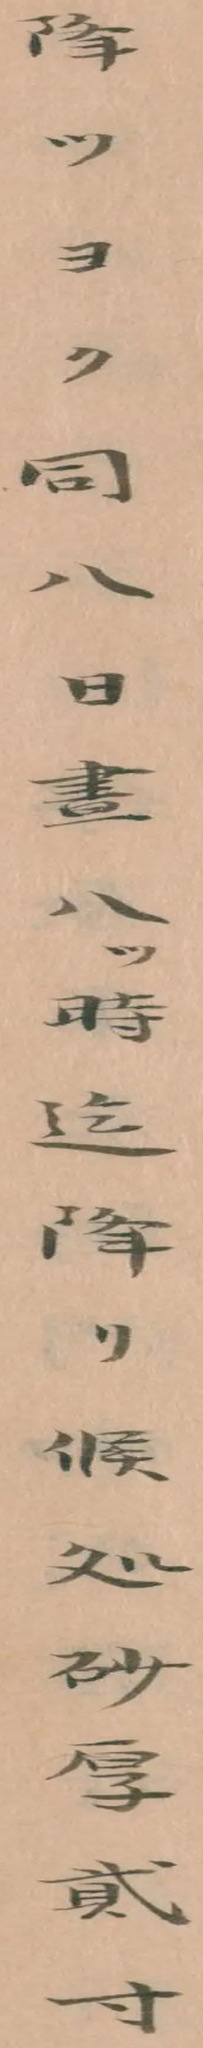降ツヨク同八日晝八ツ時迄降り候処砂暑弐寸
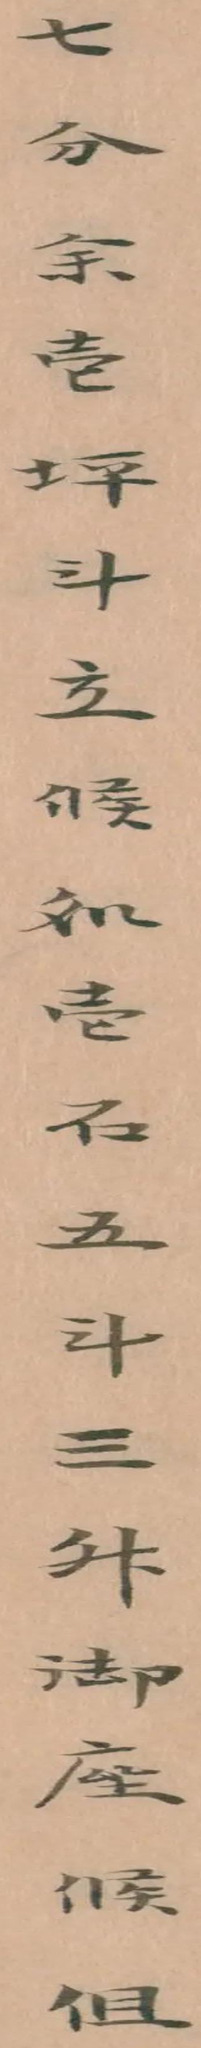七分余壱坪斗立候処壱石五斗三升御座候但
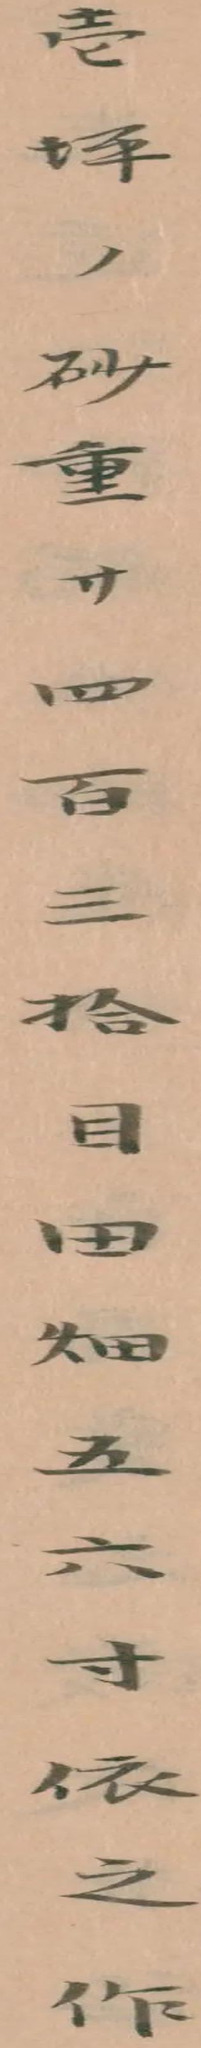壱坪ノ砂重サ四百三拾目田畑五六寸依之作
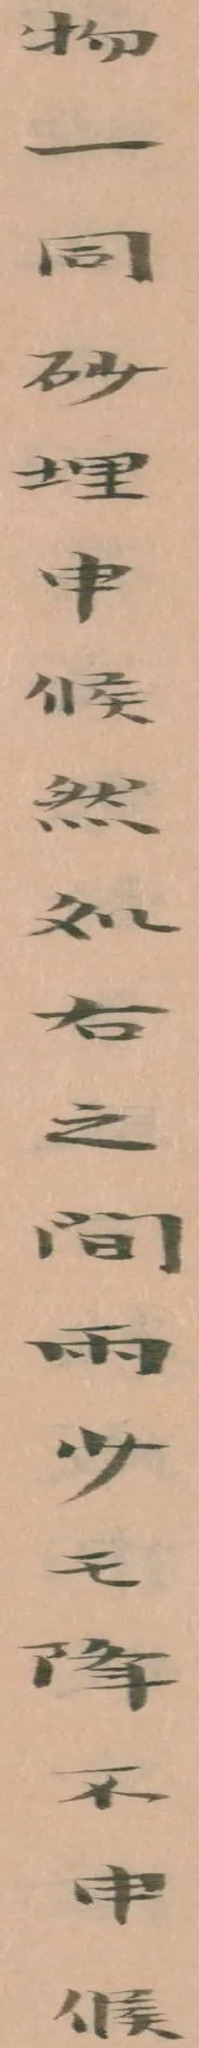物一同砂埋申候然処右之間雨少モ降不申候
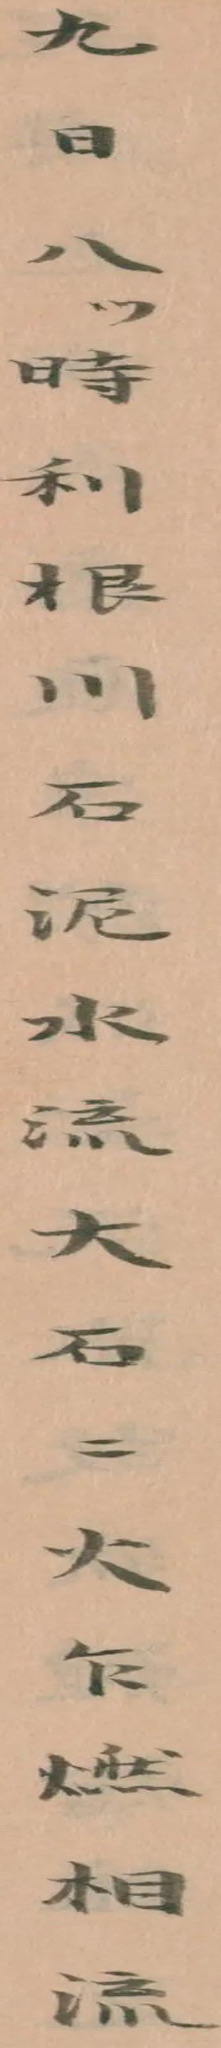九日八ツ時利根川石泥水流大石二火乍燃相流
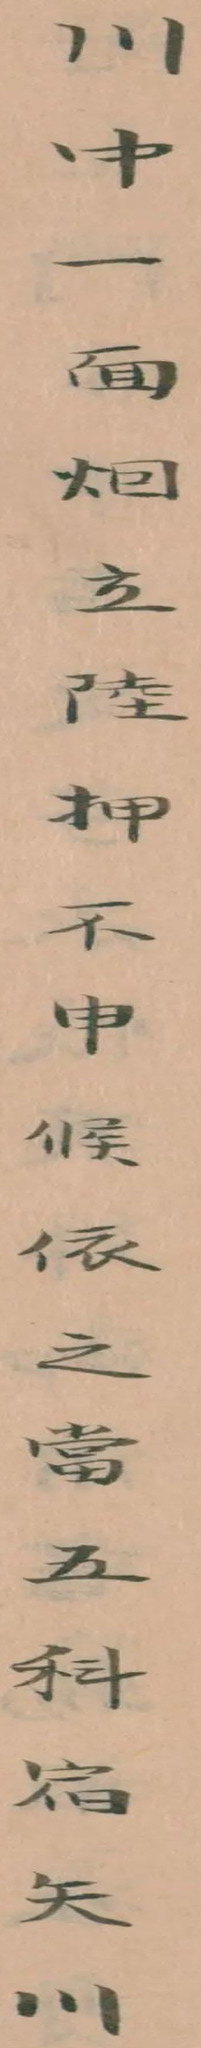川中一面烟立陸押不申候依之当五科宿矢川
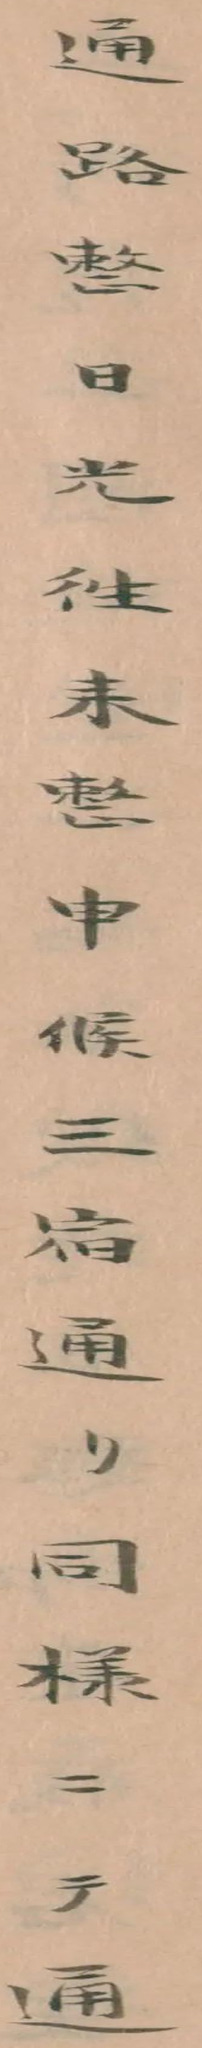通路整日光往来整申候三宿通リ同様二テ通
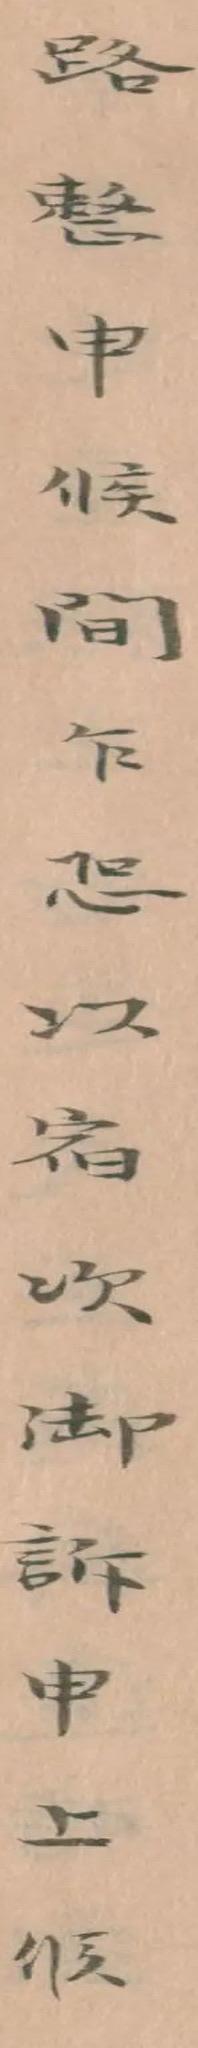路整申候間乍恐以宿次御訴申上候
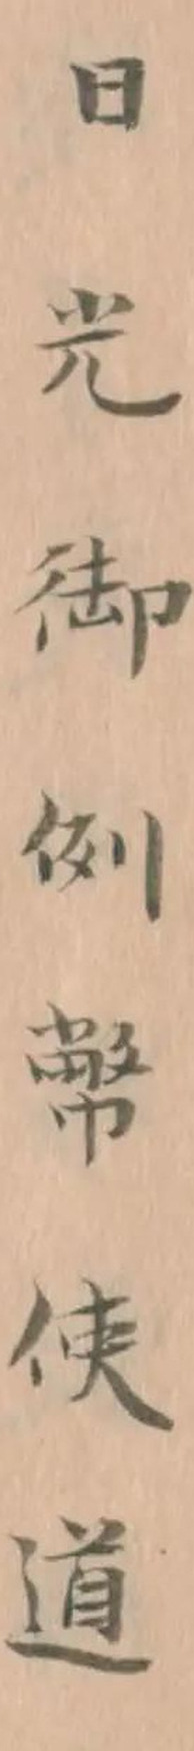日光御例幣使道
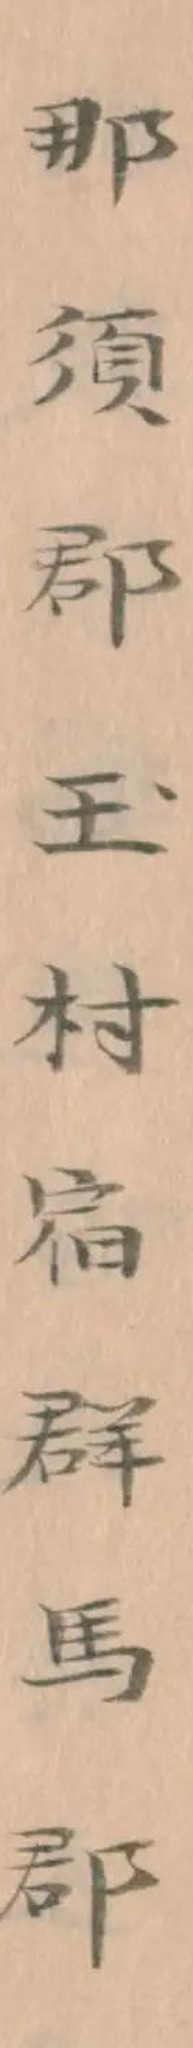那須郡玉村宿群馬郡
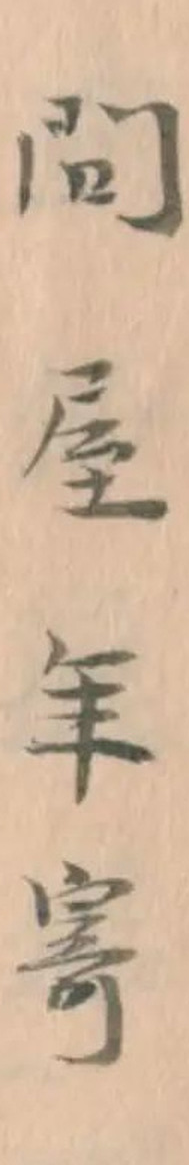問屋年寄
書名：地災撮要. 巻1(噴火山・地震ノ部)
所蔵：国立国会図書館 National Diet Library, JAPAN
